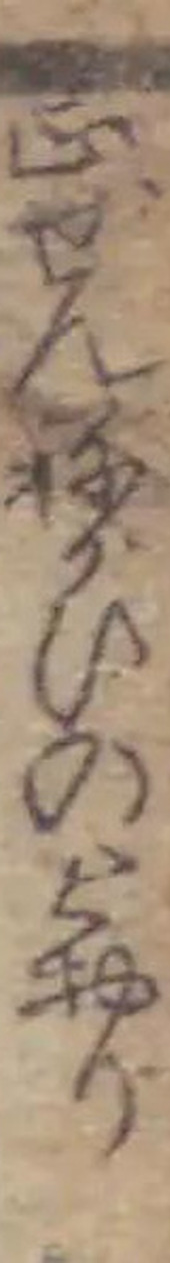正ぜんねかひのとおり
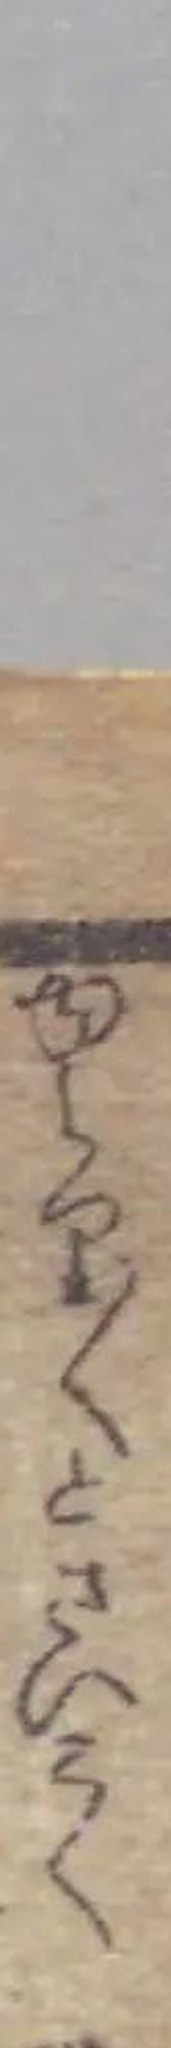ゆらり〳〵とさいこく
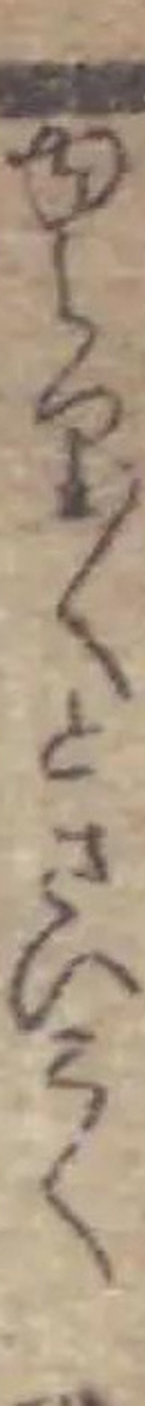ゆらり〳〵とさいこく
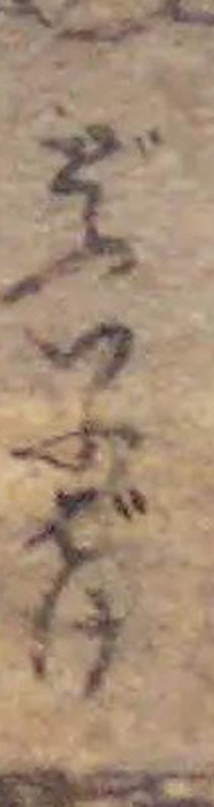どふいふばけ
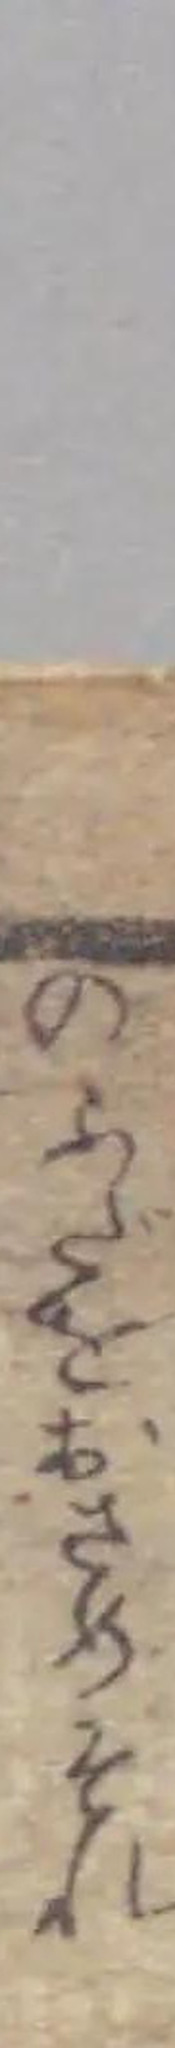のふだをおさめそれ
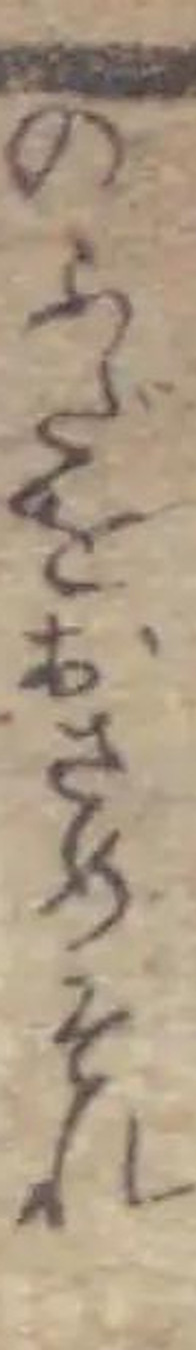のふだをおさめそれ
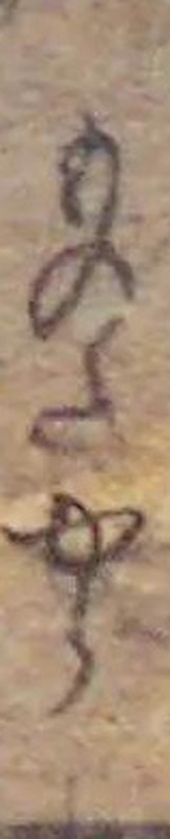ものたやら
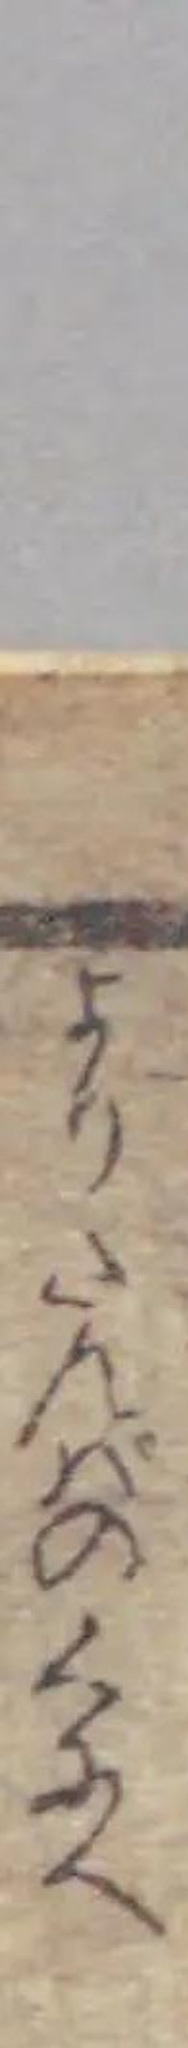よりたんばのくにへ
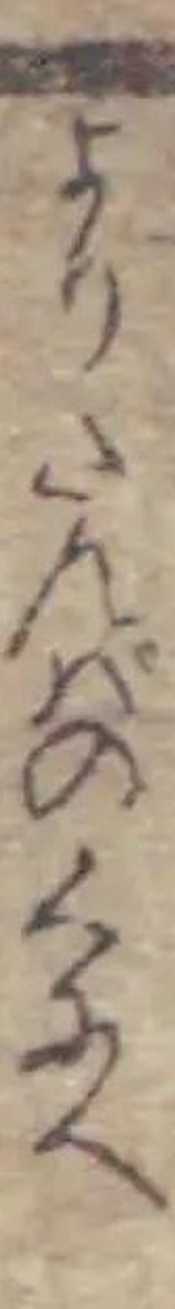よりたんばのくにへ
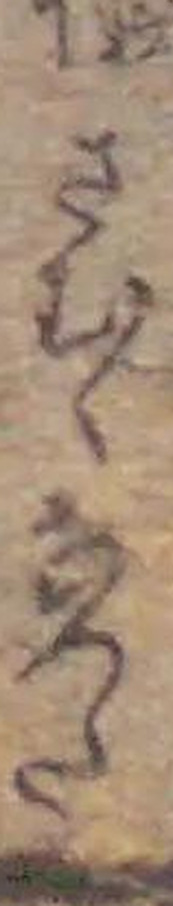さむくなつた
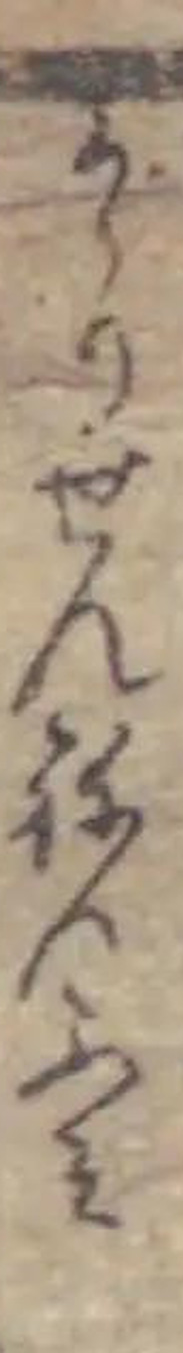かゝりせんねんふみ
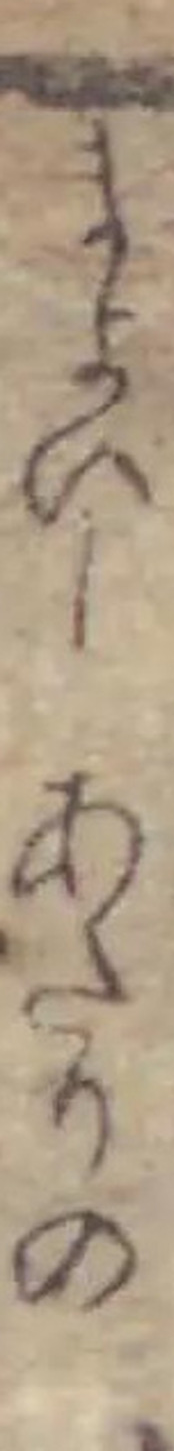まよいしあたりの
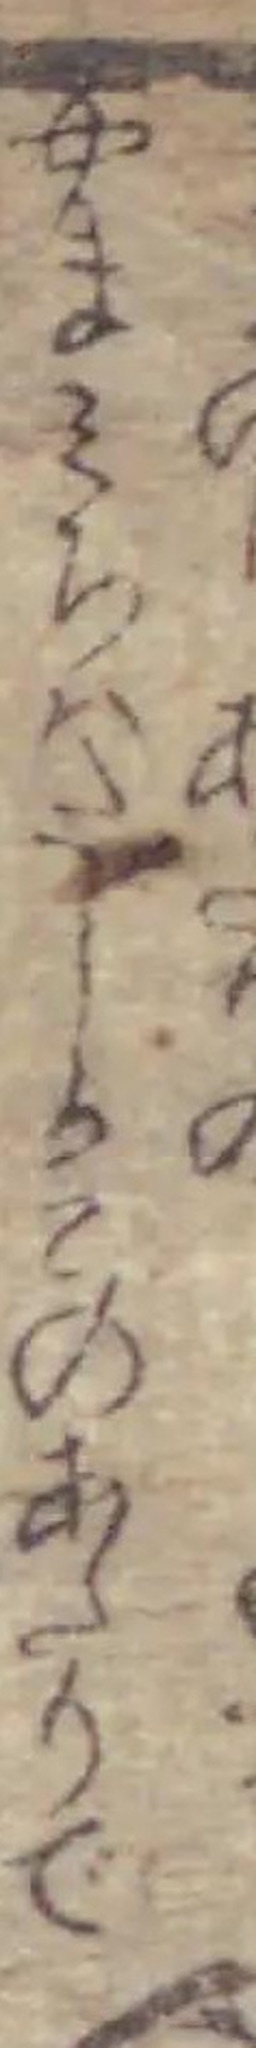やまみちはたしかこのあたりで
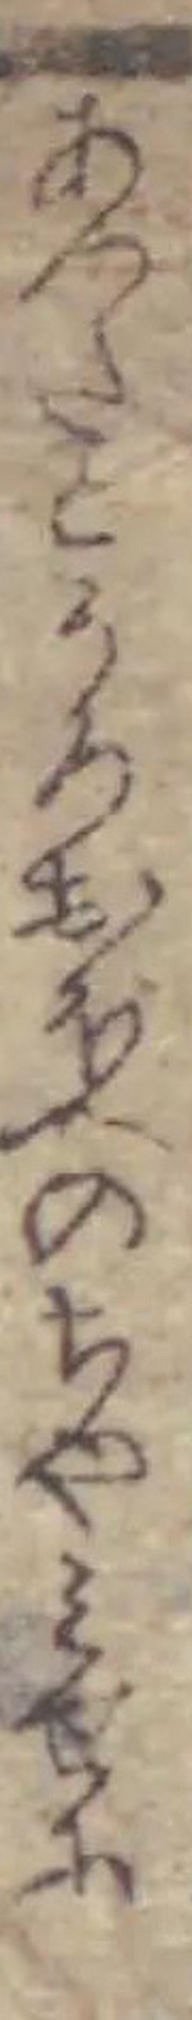あつたとうろおほへのちやみせに
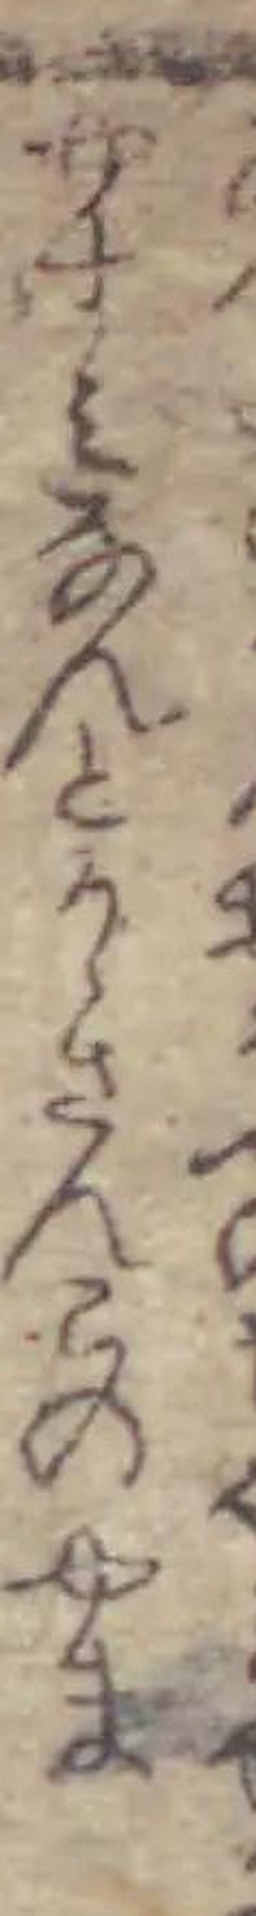やすみなんとかゝさんこのやま
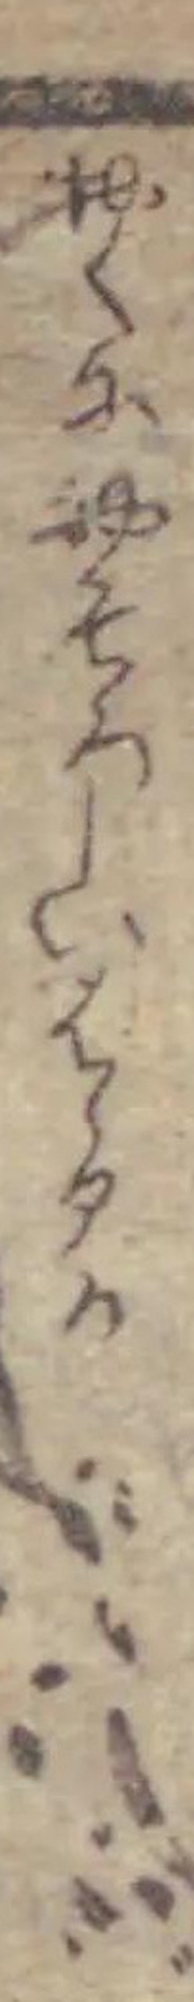おくにおそろしいはゝあか
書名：もふもふもふ怖噺 2巻
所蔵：国立国会図書館 National Diet Library, JAPAN
